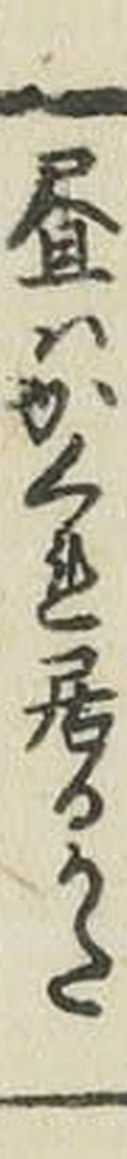昼はかくれ居るかた
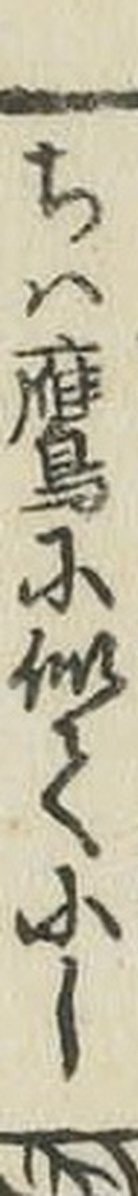ちは鷹に似て小し
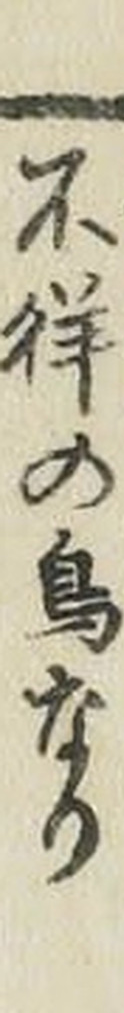不徉の鳥なり
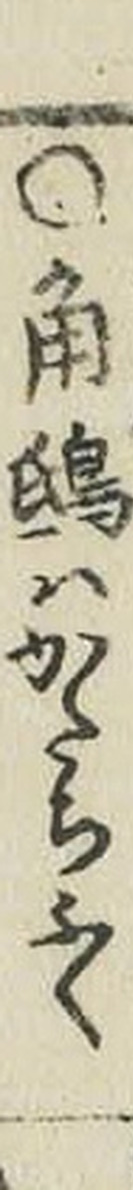○角鴟はかたちふく
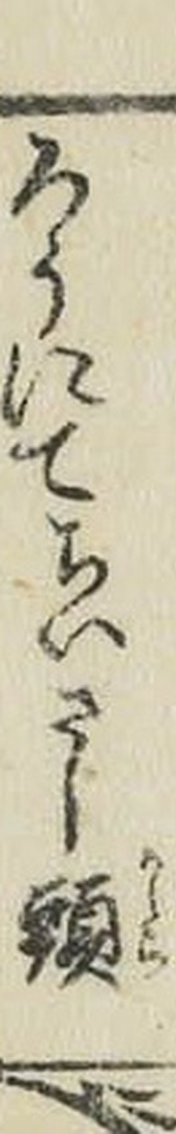ろうにてちいさし頭
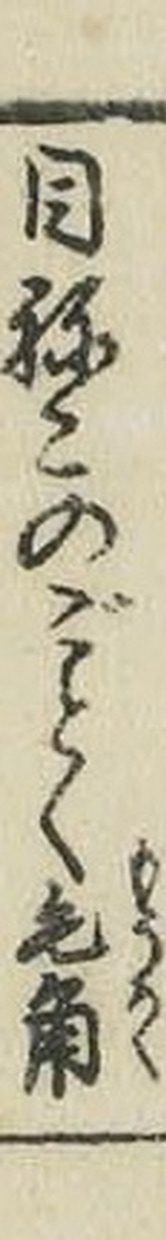目ねこのごとく毛角
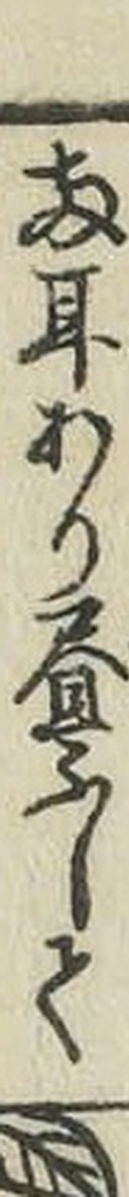両耳あり昼ふして
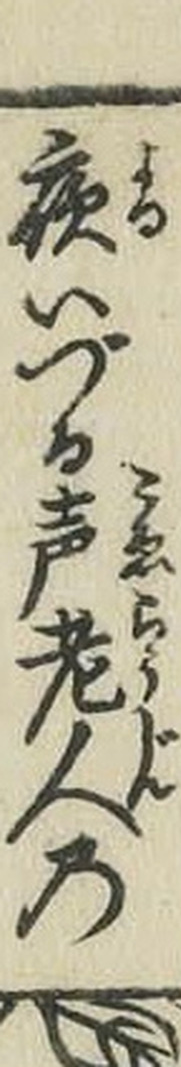夜いづる声老人の
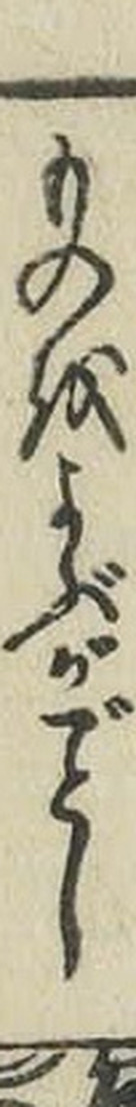ものをよぶがごとし

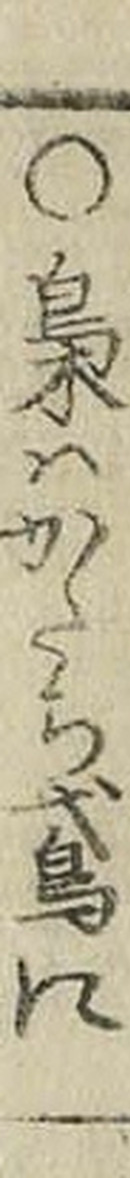○梟はかたち鳶に
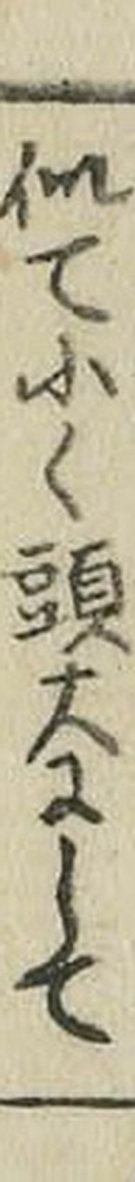似て小く頭大にして
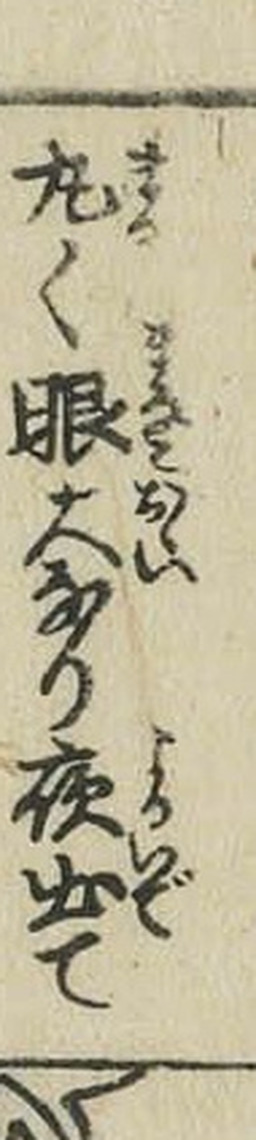丸く眼大なり夜出て
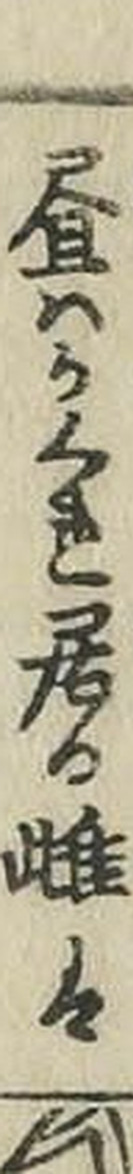昼はかくれ居る雌は
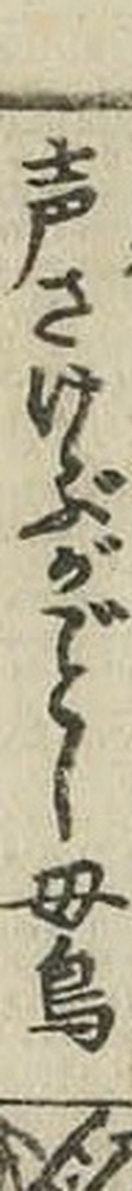声さけぶがごとし母鳥
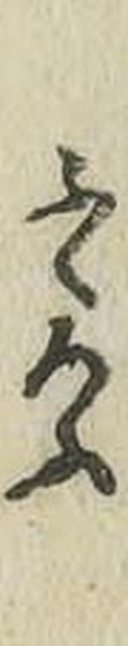ふくろふ
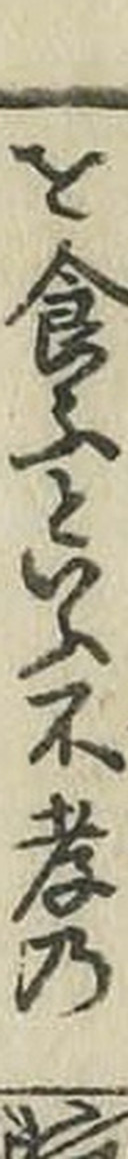を食ふといふ不孝の
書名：増補頭書訓蒙図彙大成 10巻 6:巻之12-13
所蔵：東京学芸大学教育コンテンツアーカイブ
